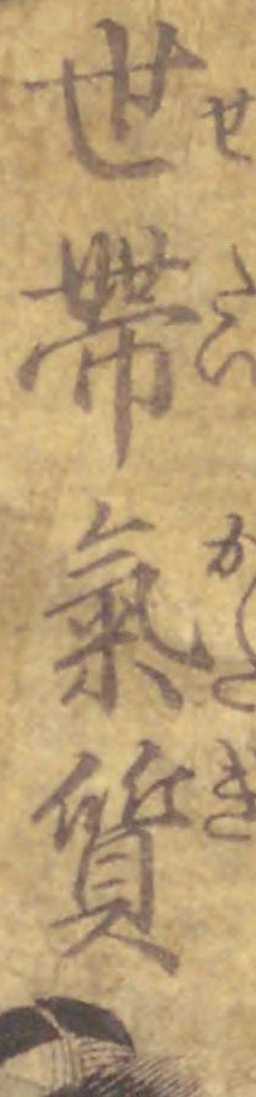世帯気質

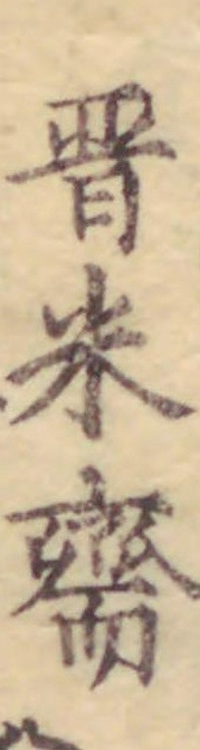晋米齋
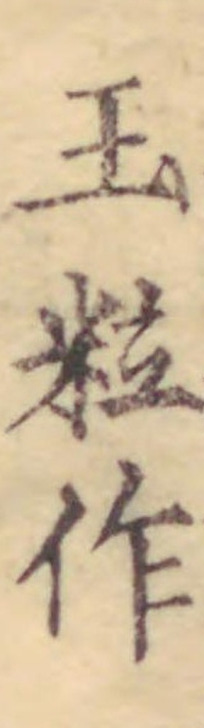玉粒作
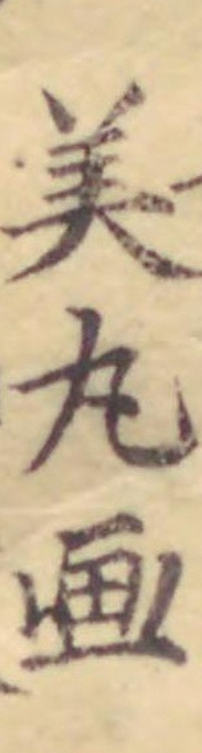美丸画
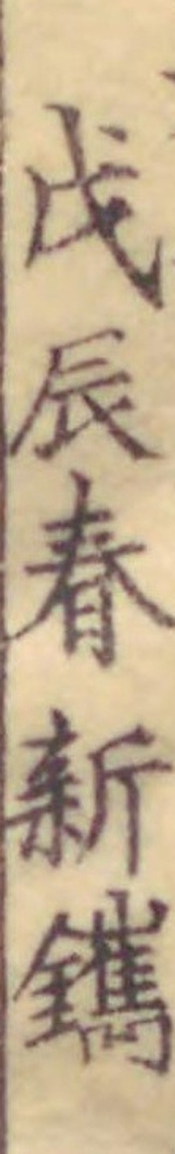戊辰春新䥴
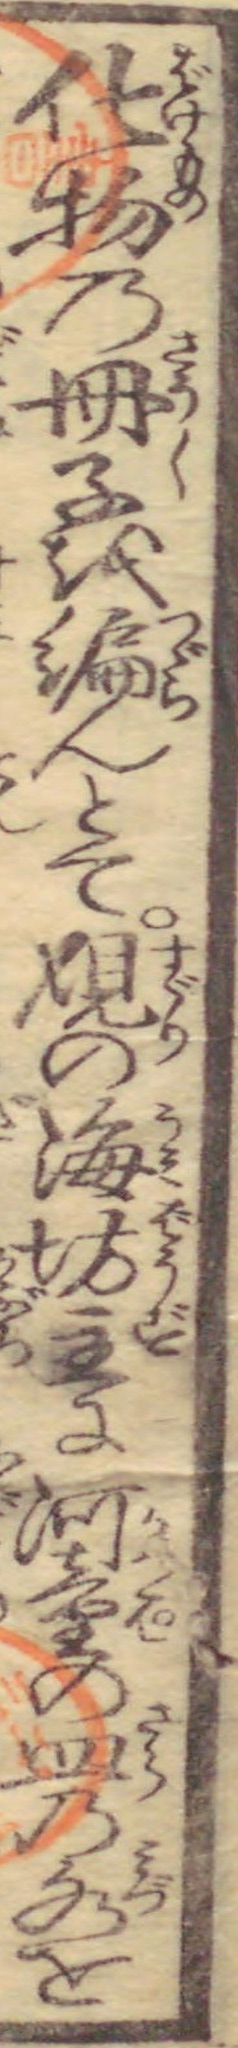化物の冊子を編んとて。硯の海坊主に河童の皿の水を
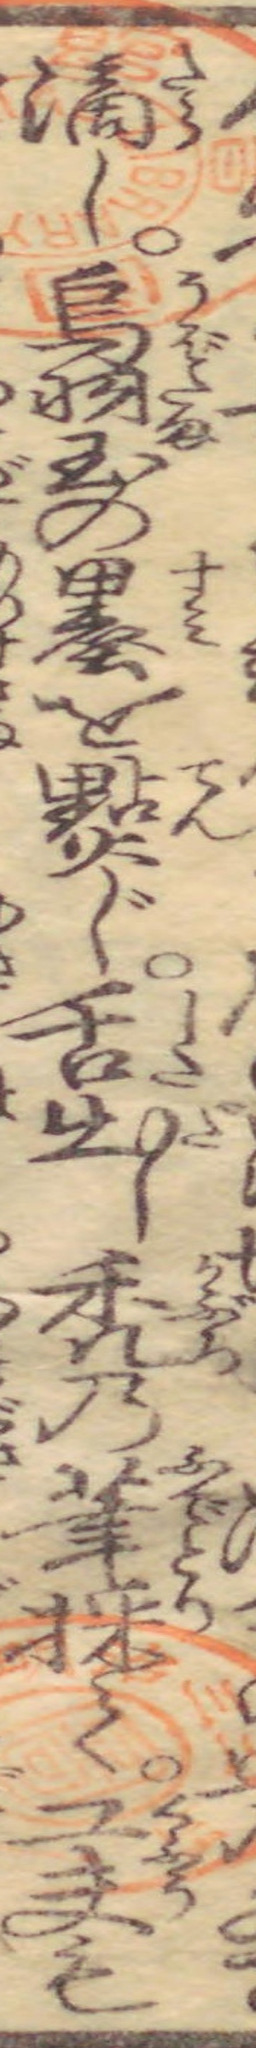滴し。烏羽玉の墨を點じ。舌出し禿の筆採て。工夫も
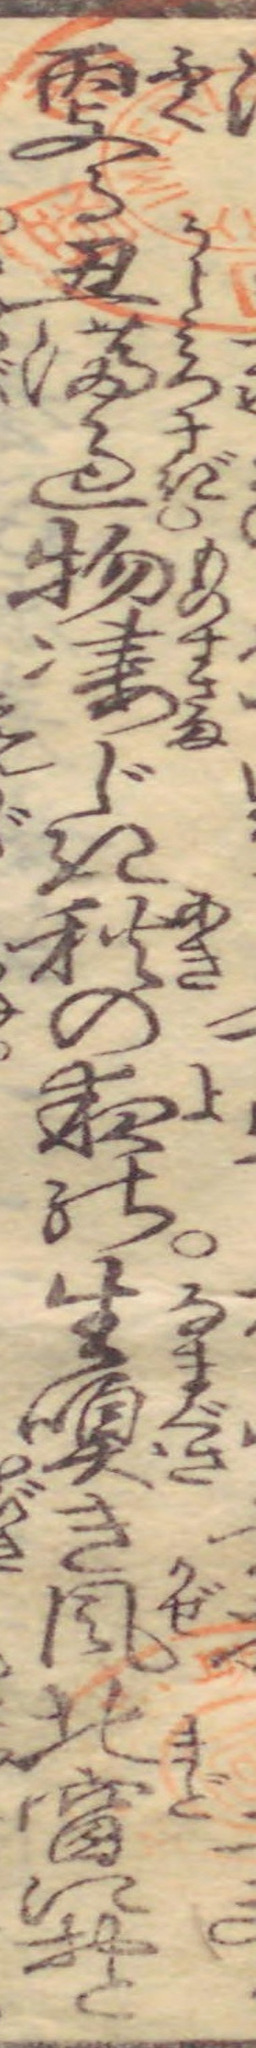更る丑満過。物凄じき秋の夜の。生臭き風北窓におと
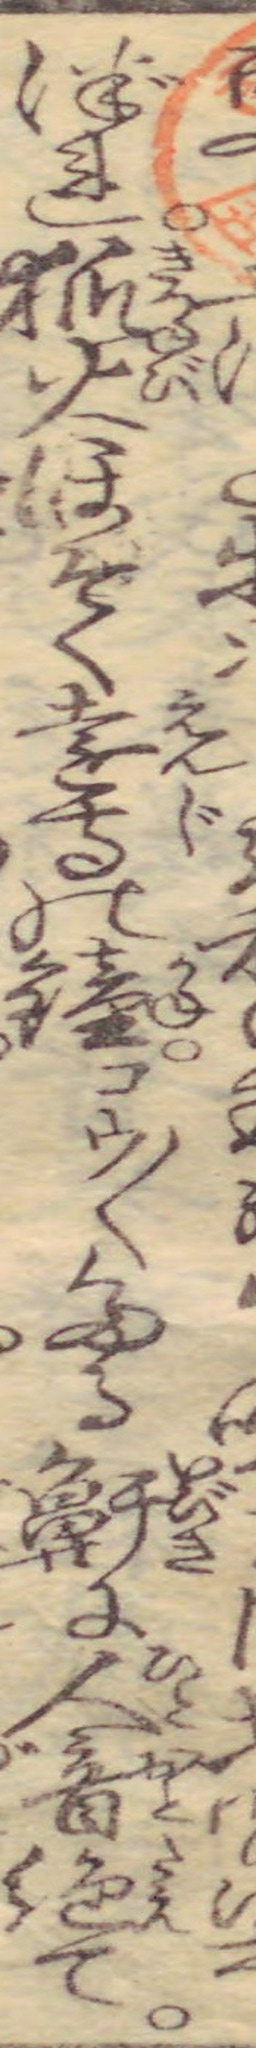づれ。狐火ほそく遠寺の鐘。コウ〳〵たる鼾に人音絶て。
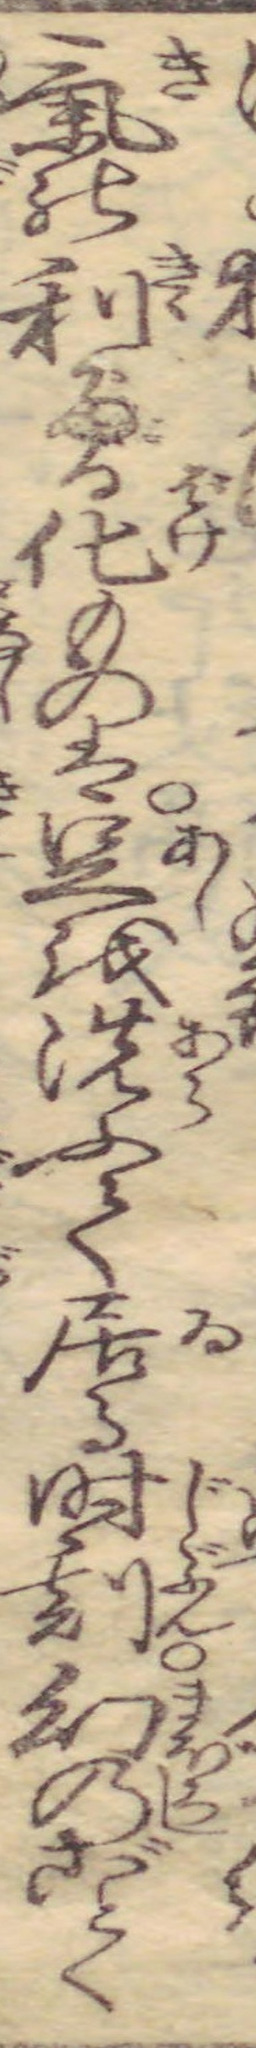気の利たる化ものは。足を洗ふて居る時刻。幻のごとく
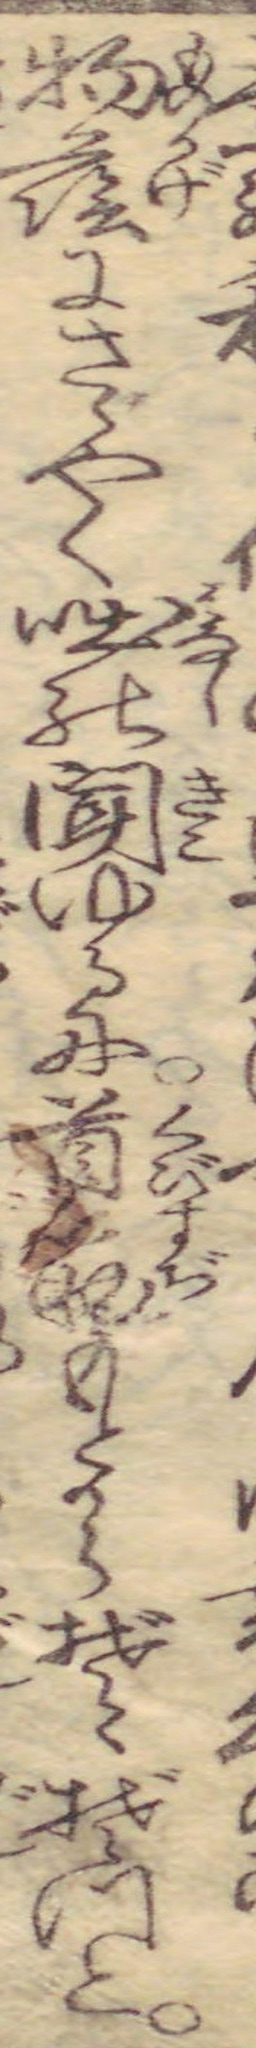物蔭にさゝやく咄の聞ゆるに。首筋もとからぞゝぞつと。
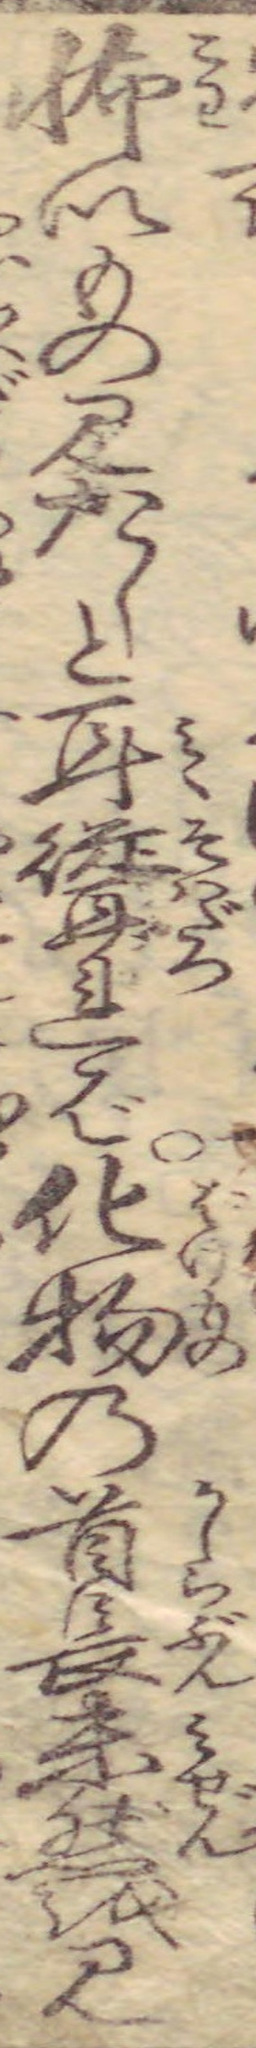怖いもの見たしと耳聳れば。化物の首長未然を見
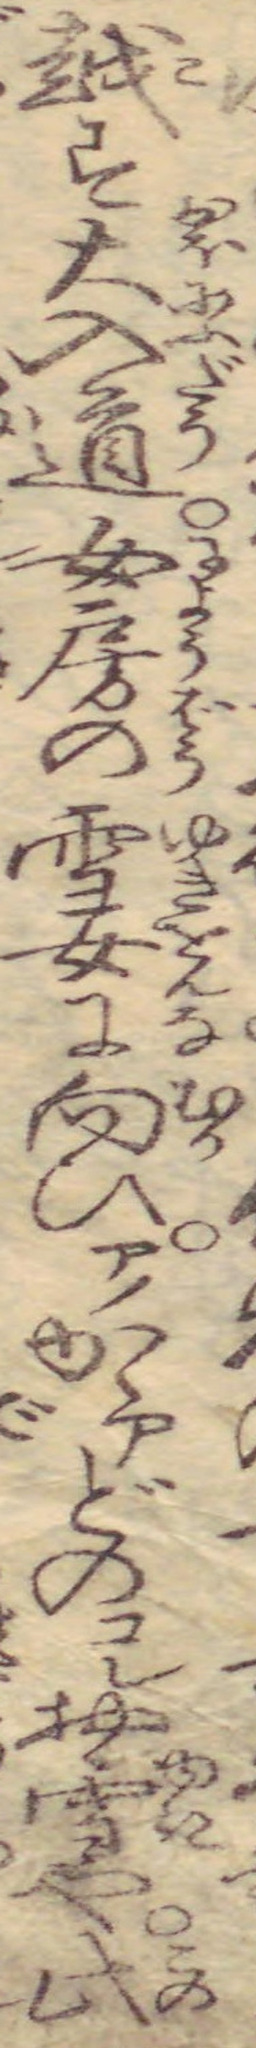越す大入道。女房の雪女に向ひ。アノかゝァどのコレお雪や。此
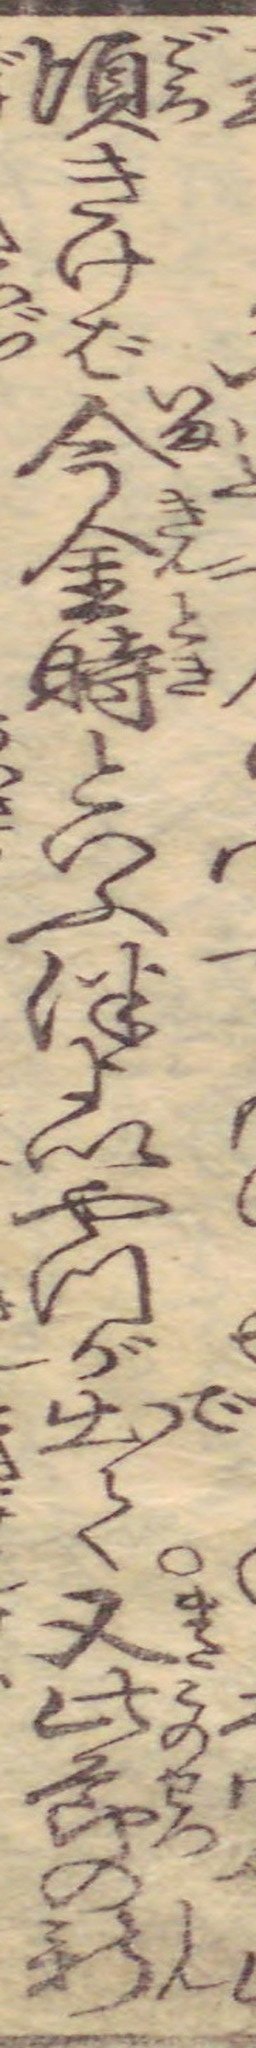頃きけば今金時といふつよいやつが出て。又此節の新
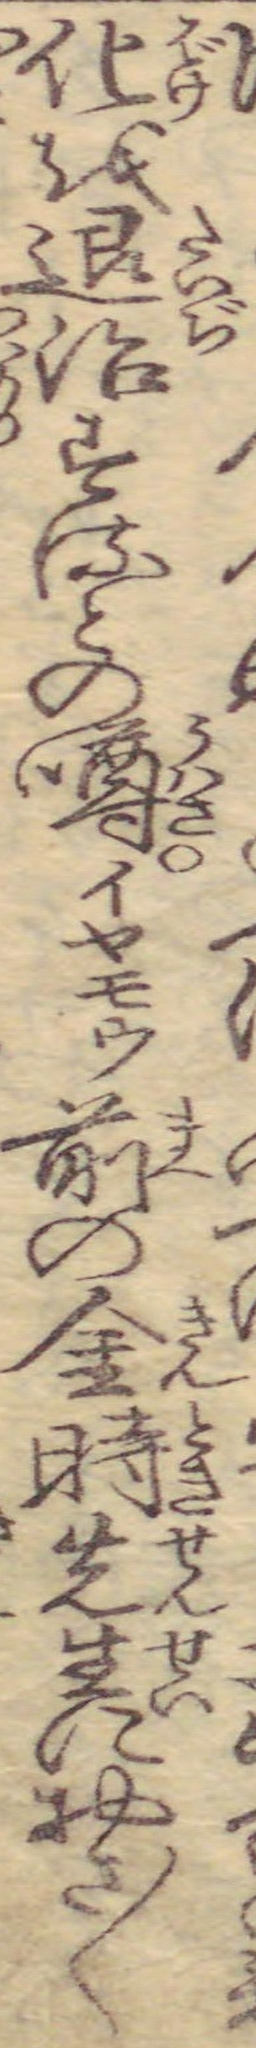化を退治するとの噂。イヤモウ前の金時先生におさ〳〵
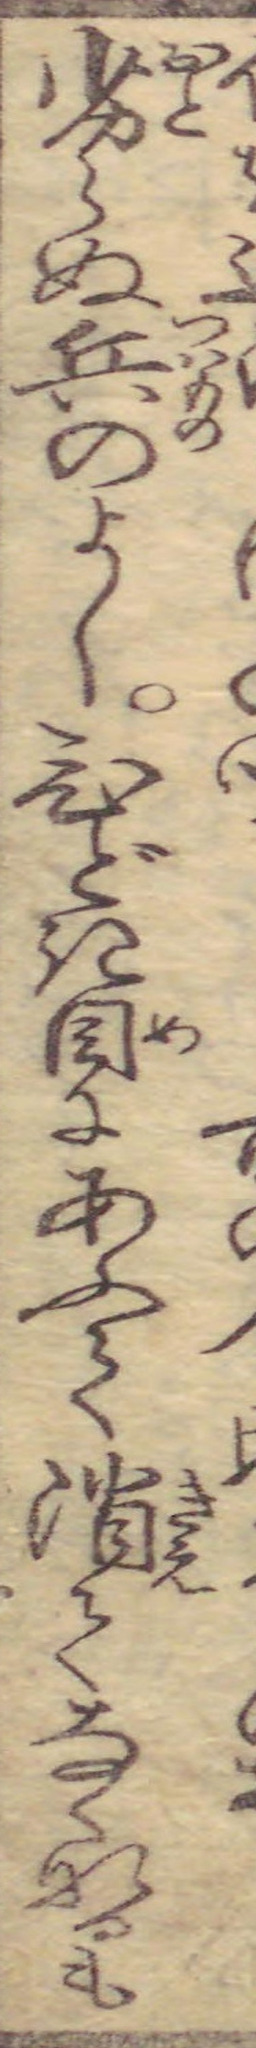劣らぬ兵のよし。ひどき目にあふて消てなくなるも
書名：化物世帯氣質
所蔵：国立国会図書館 National Diet Library, JAPAN
